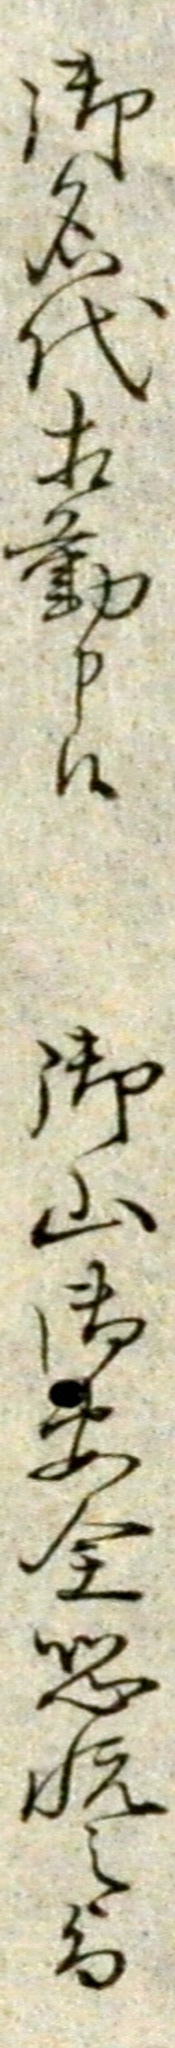御名代相勤申候御山御安全恐悦之旨
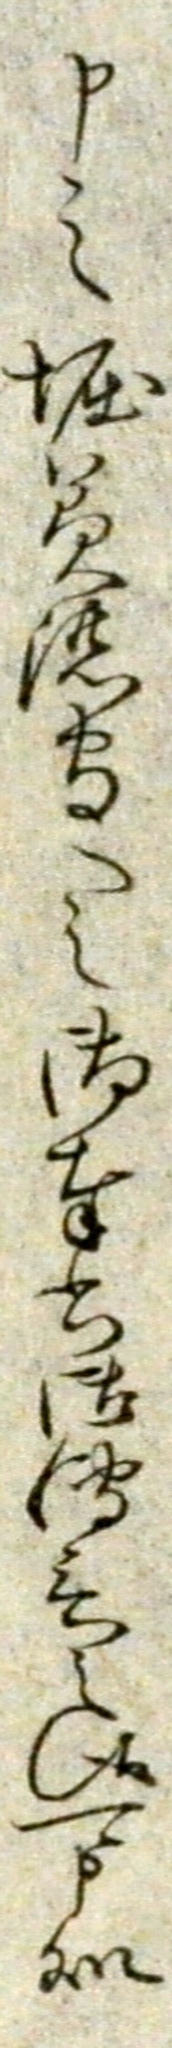申之堀美濃守へ之御奉書御伝言之趣可申処
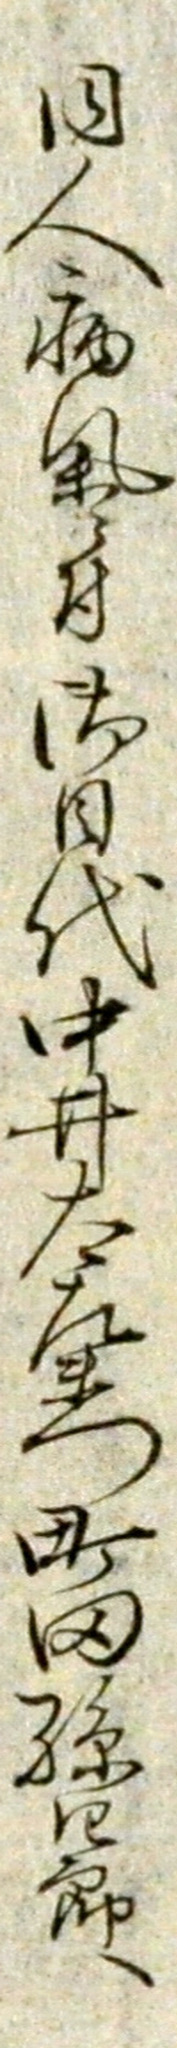同人病気ニ付御目代中井太左衛門町田孫四郎へ
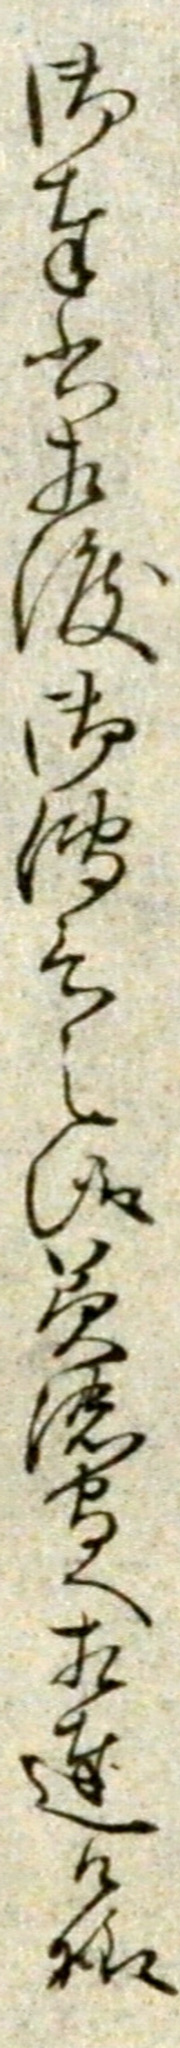御奉書相渡御伝言之趣美濃守へ相達候様
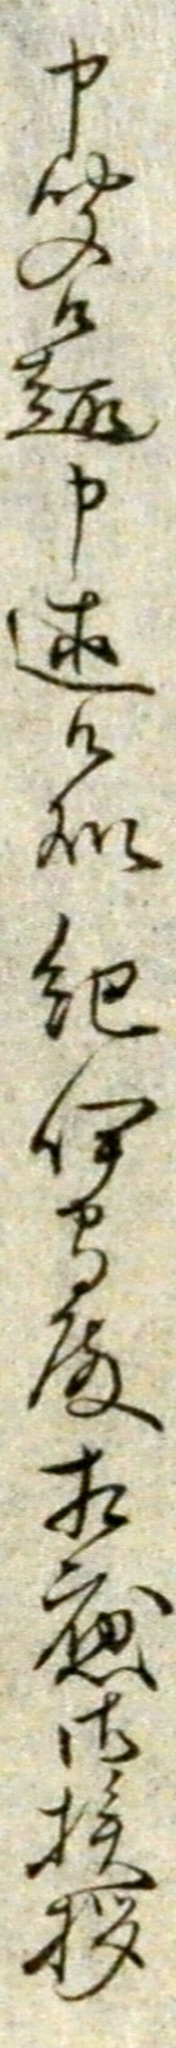申聞候趣申述候処紀伊守殿相応御挨拶
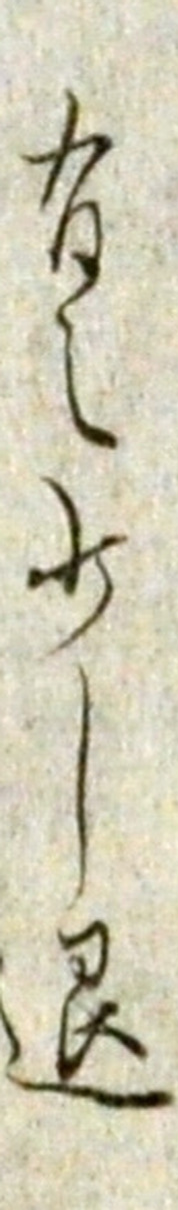有之少し退
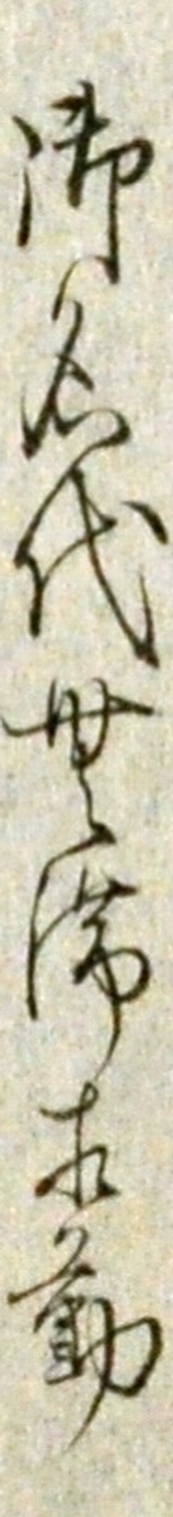御名代無滞相勤
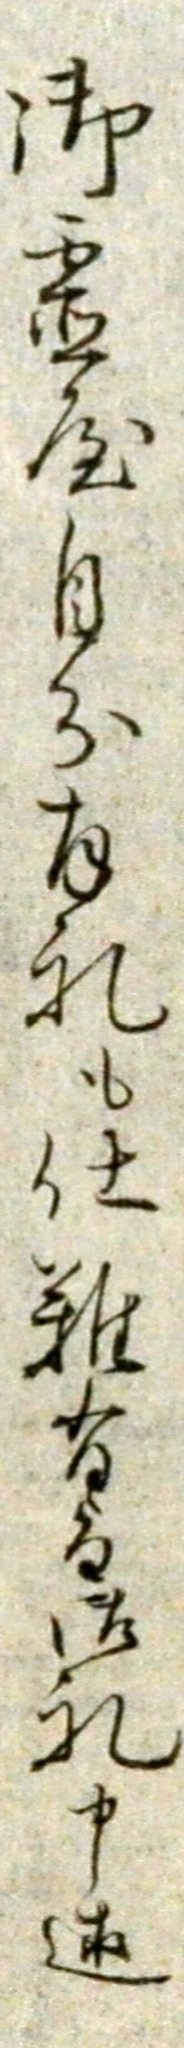御霊屋自分拝礼も仕難有旨御礼申述
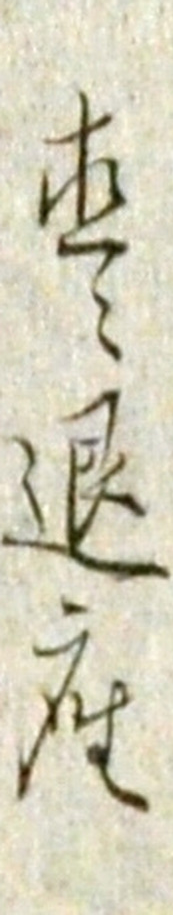直ニ退座

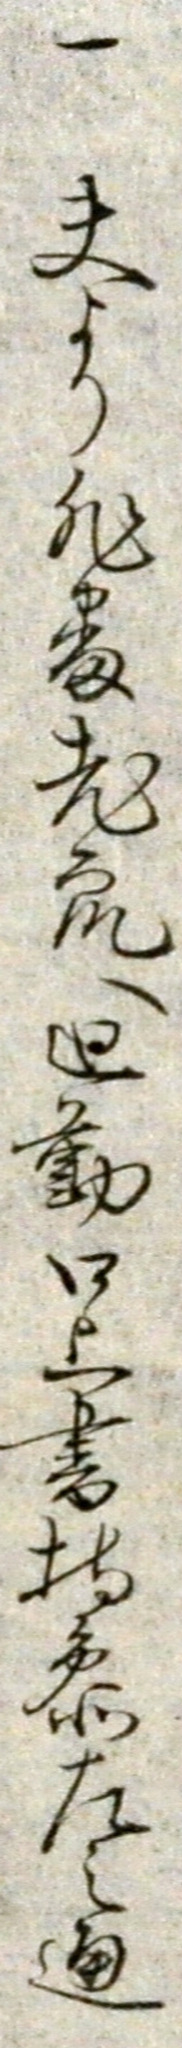一夫より非番老衆へ廻勤口上書持参左之通
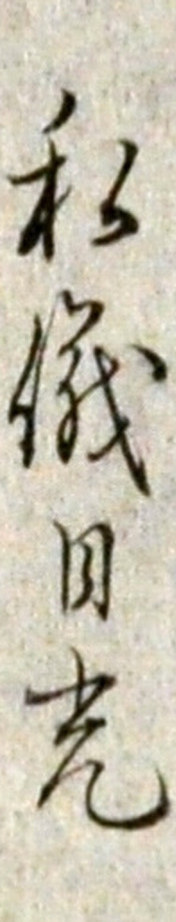私儀日光
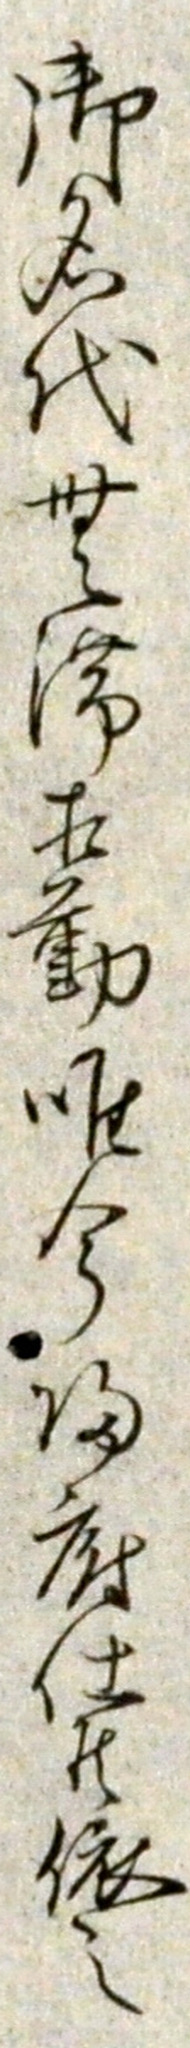御名代無滞相勤唯今帰府仕候依之
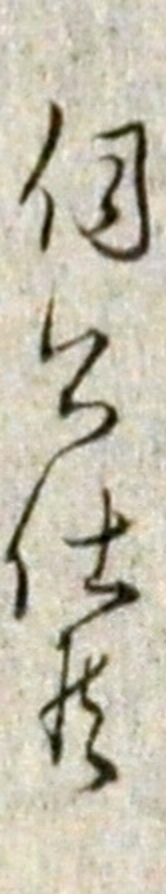伺公仕候
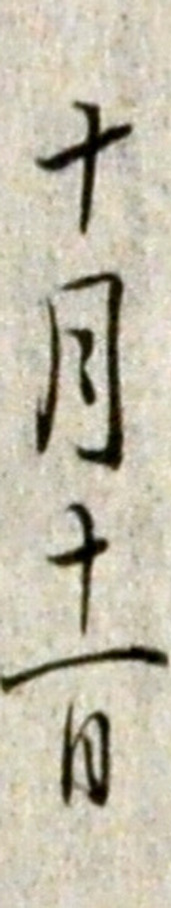十月十一日
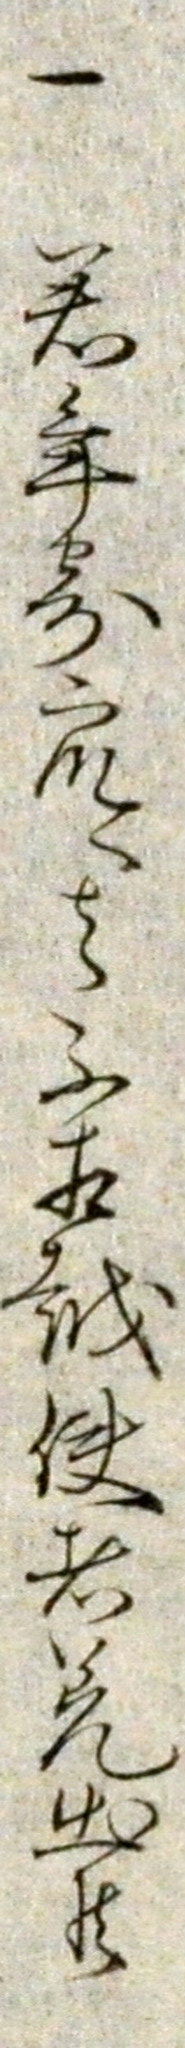一若年寄衆へは不相越使者差出候
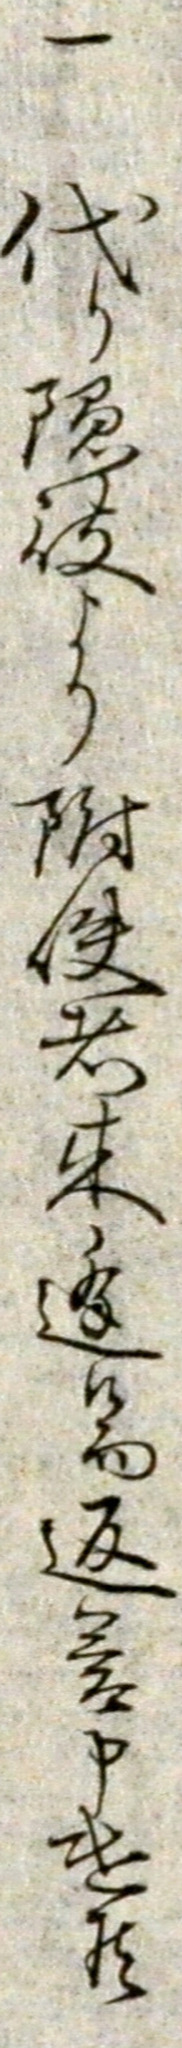一代り隠岐より附使者来逢候而返答申遣候
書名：日光御名代相勤候節ノ留
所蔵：伊那市立高遠町図書館・合同会社AMANE
